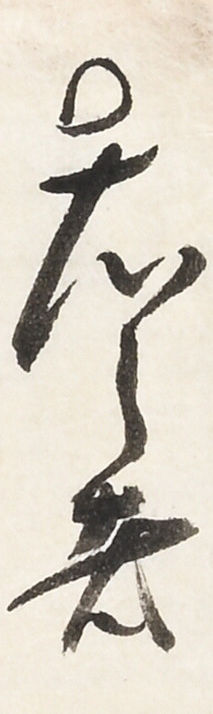〇右之者
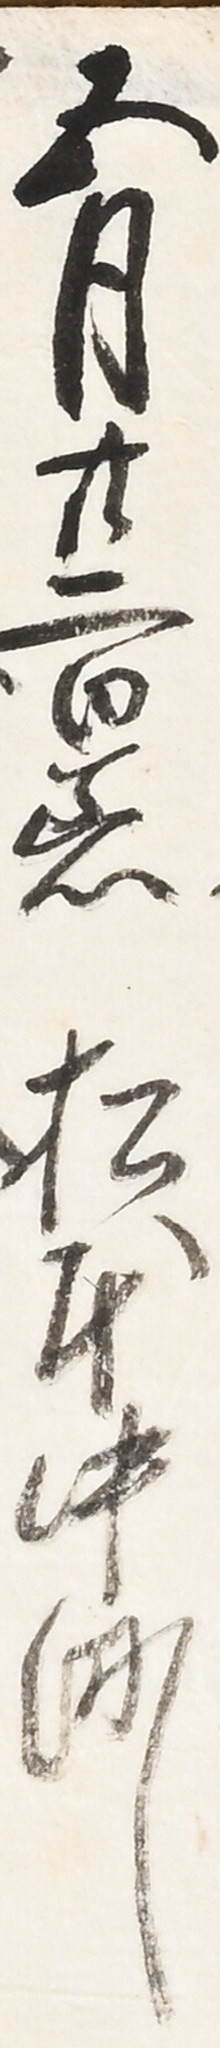五月廿二日着松本中町
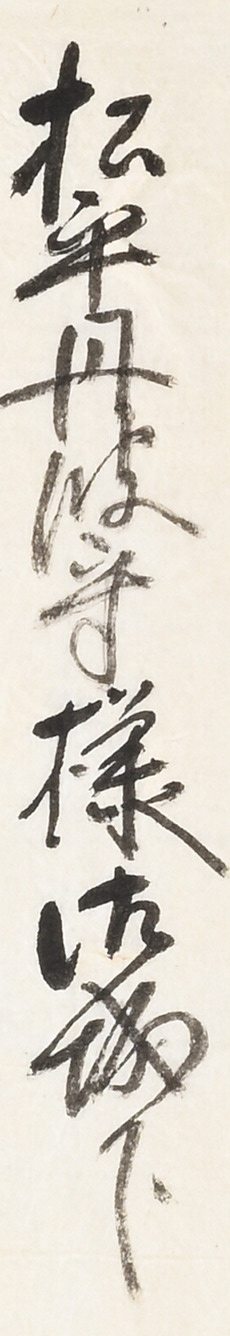松平丹波守様御城下
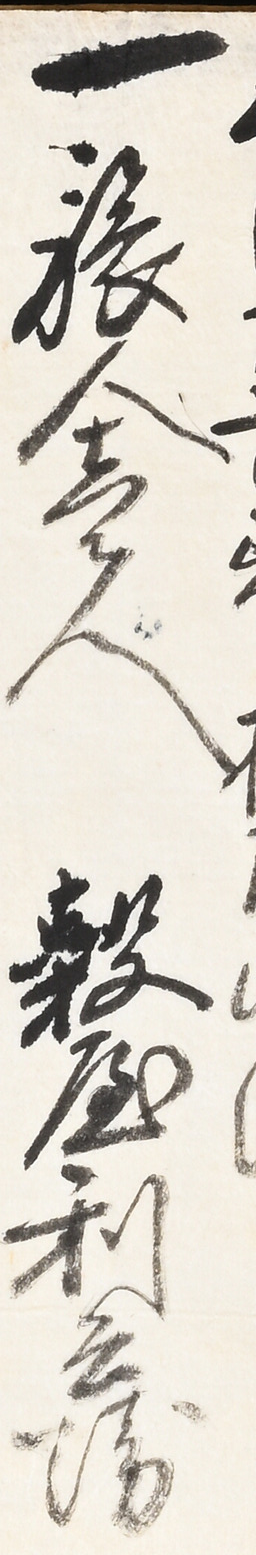一旅人壱人穀屋利兵衛
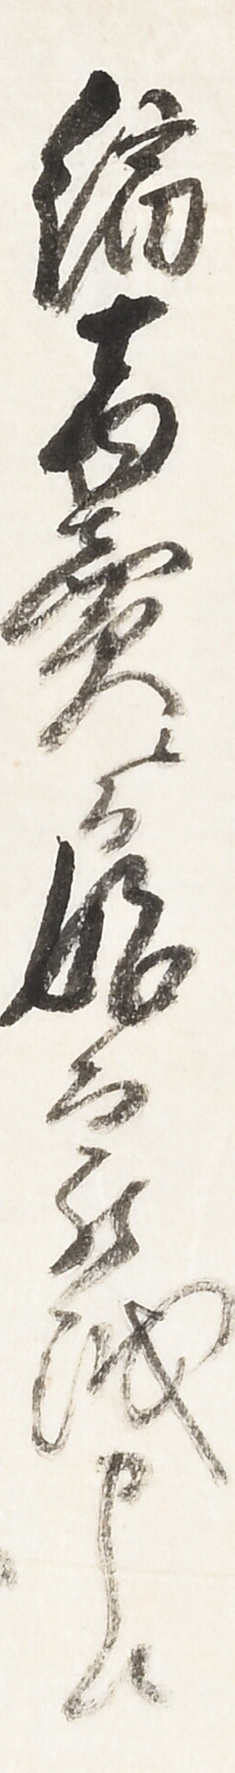縮商売ニ而始而罷越申候
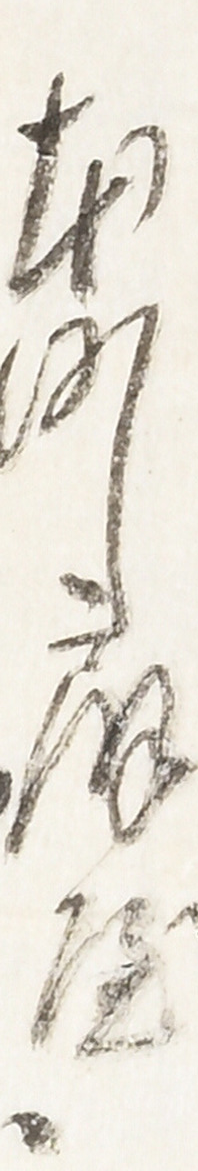本町扇屋
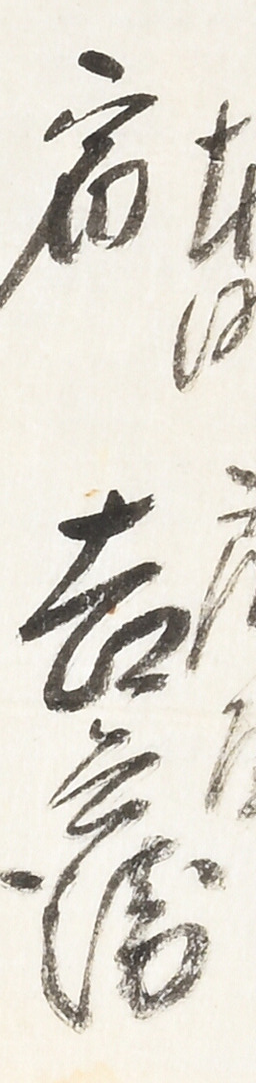宿吉兵衛
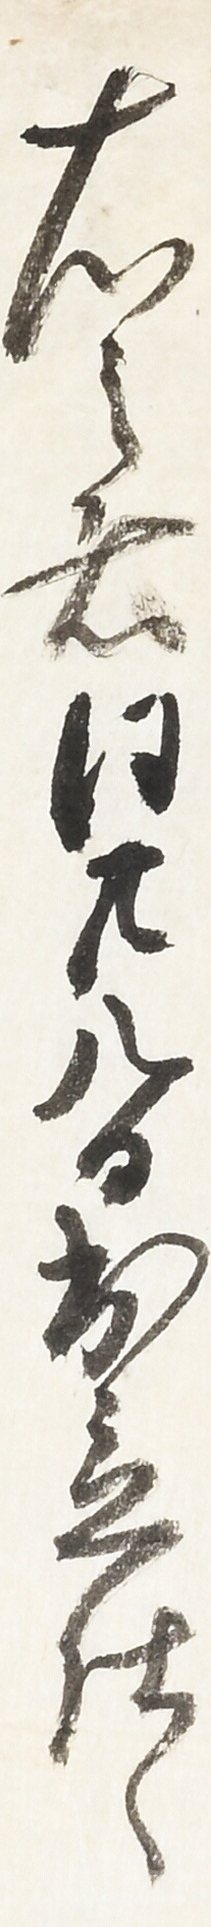右之者同廿八日出立仕候
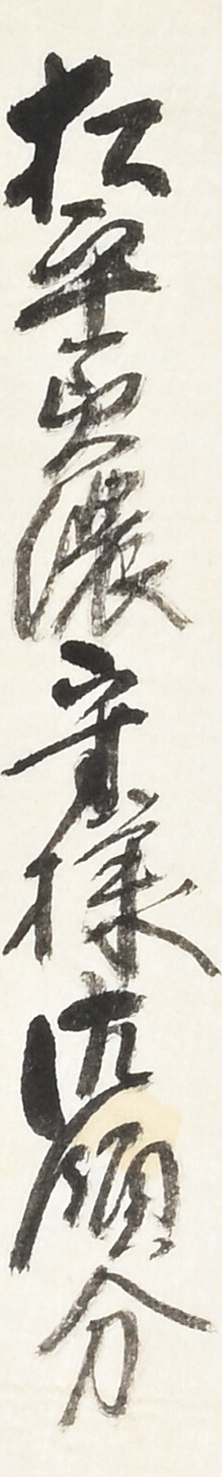松平美濃守様御領分
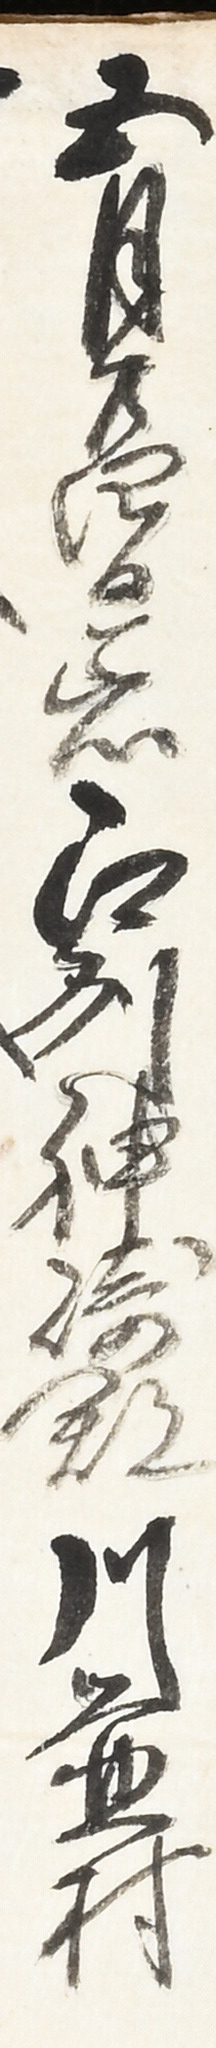五月廿四日着江州神崎郡川並村
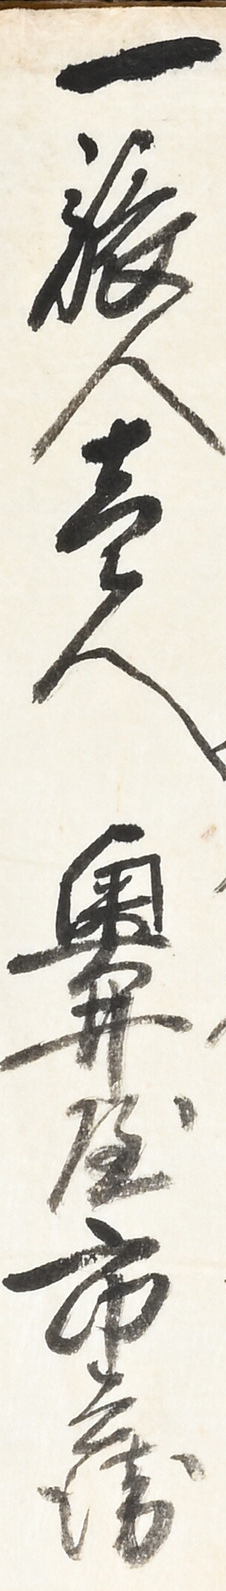一旅人壱人菱屋惣兵衛
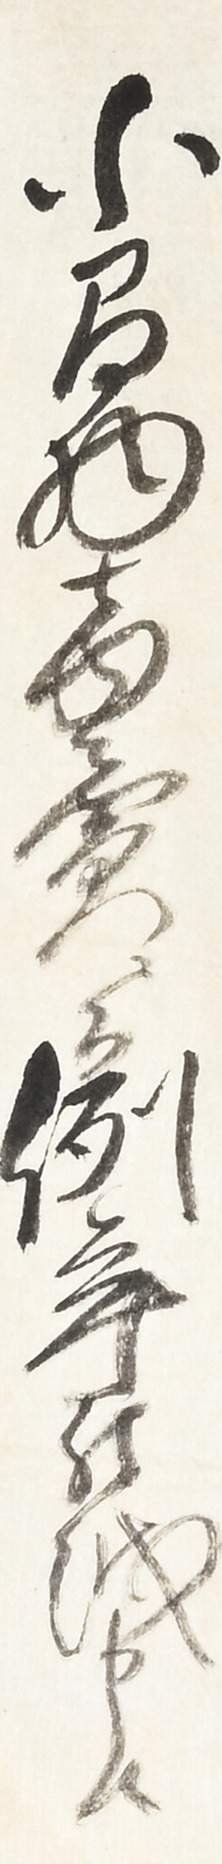小間物商売ニ而例年罷越申候

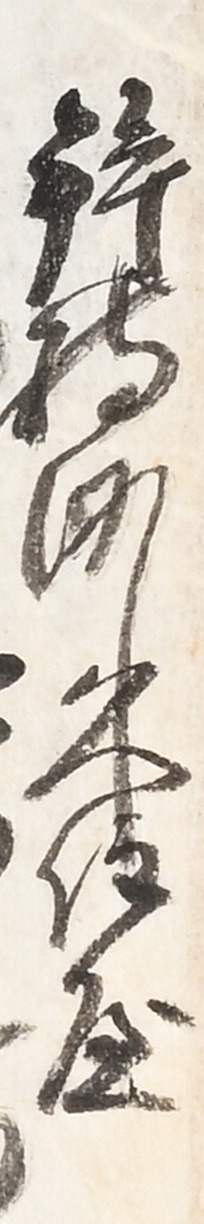鉾持町久住屋
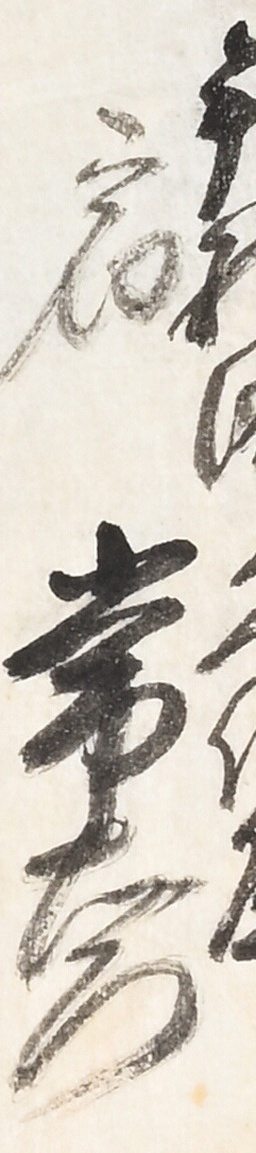宿常右衛門
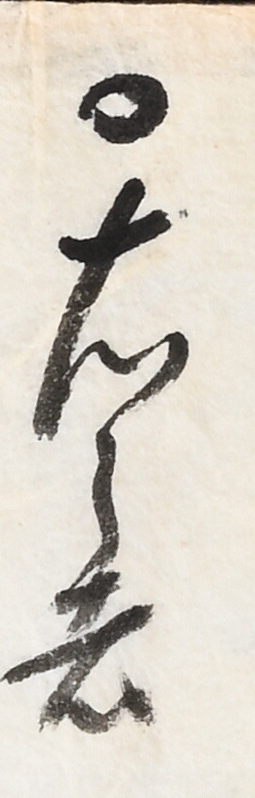〇右之者
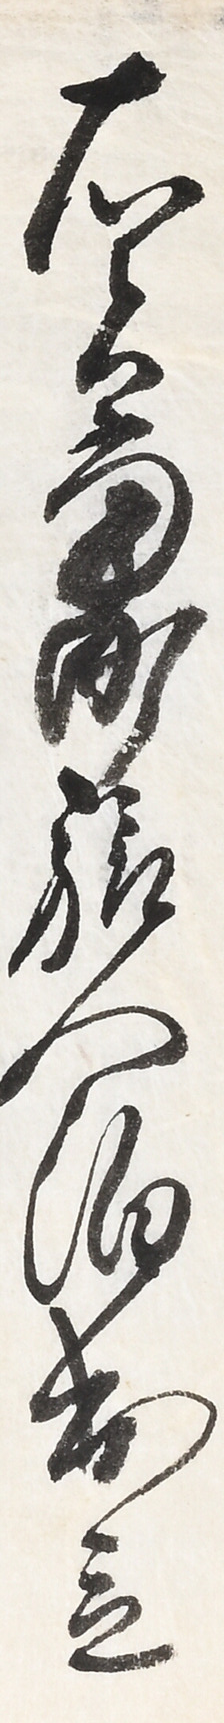右者当町旅人泊出立
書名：旅人泊控帳
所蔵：伊那市立高遠町図書館・合同会社AMANE
